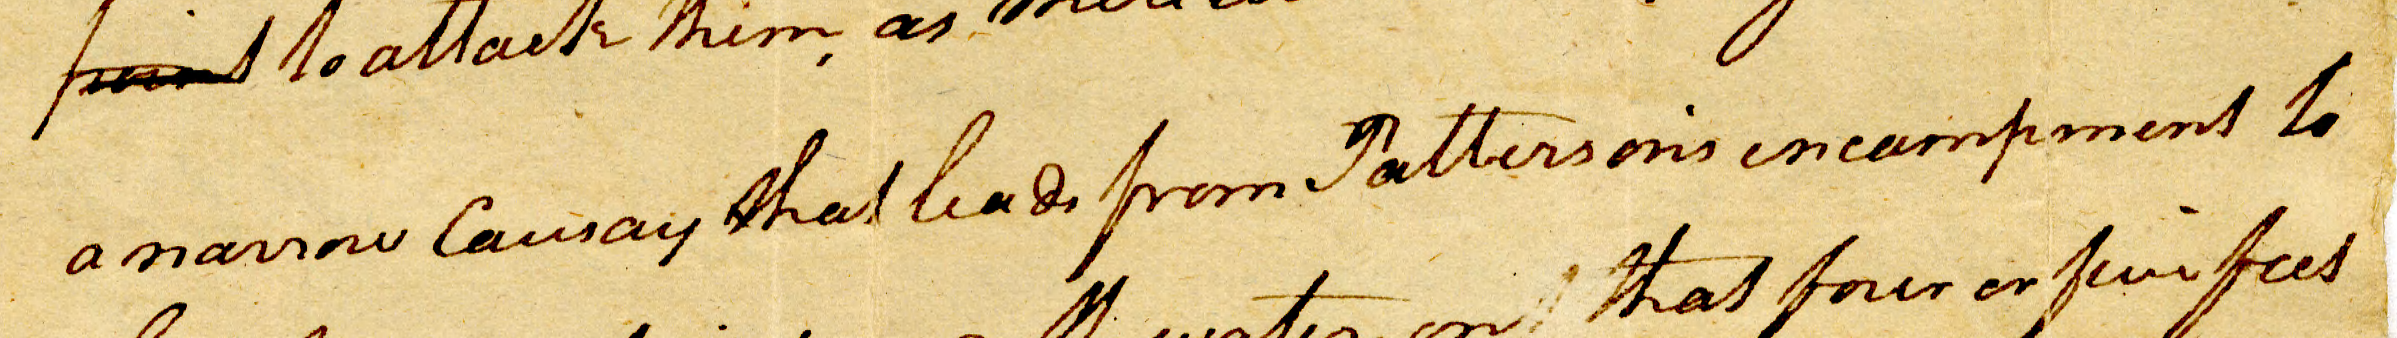a narrow Causay that leads from Patterson's encampment to
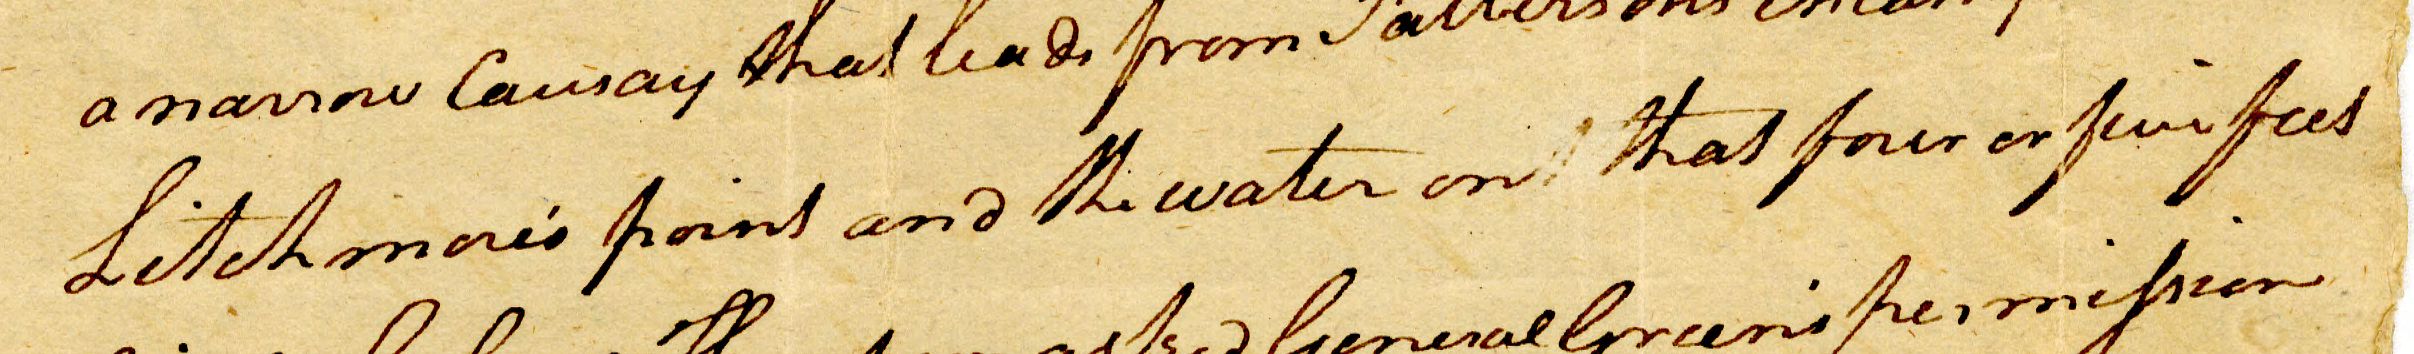Litchmore's points and the water on that four or five feet
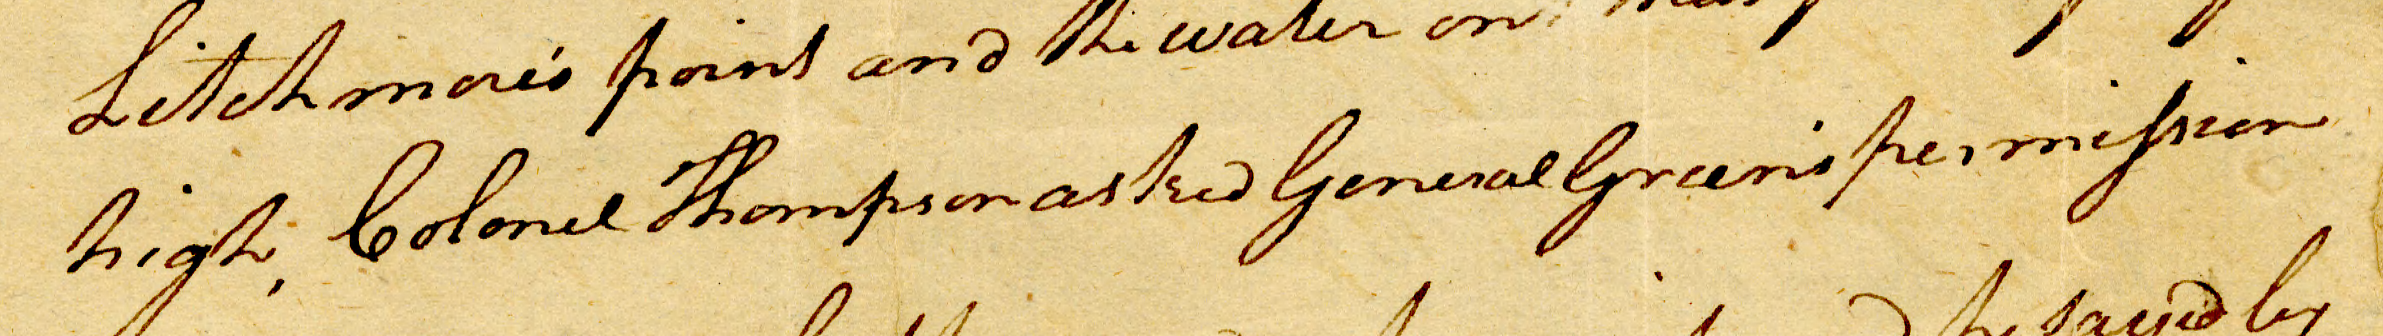high, Colonel Thompson asked General Green's permission
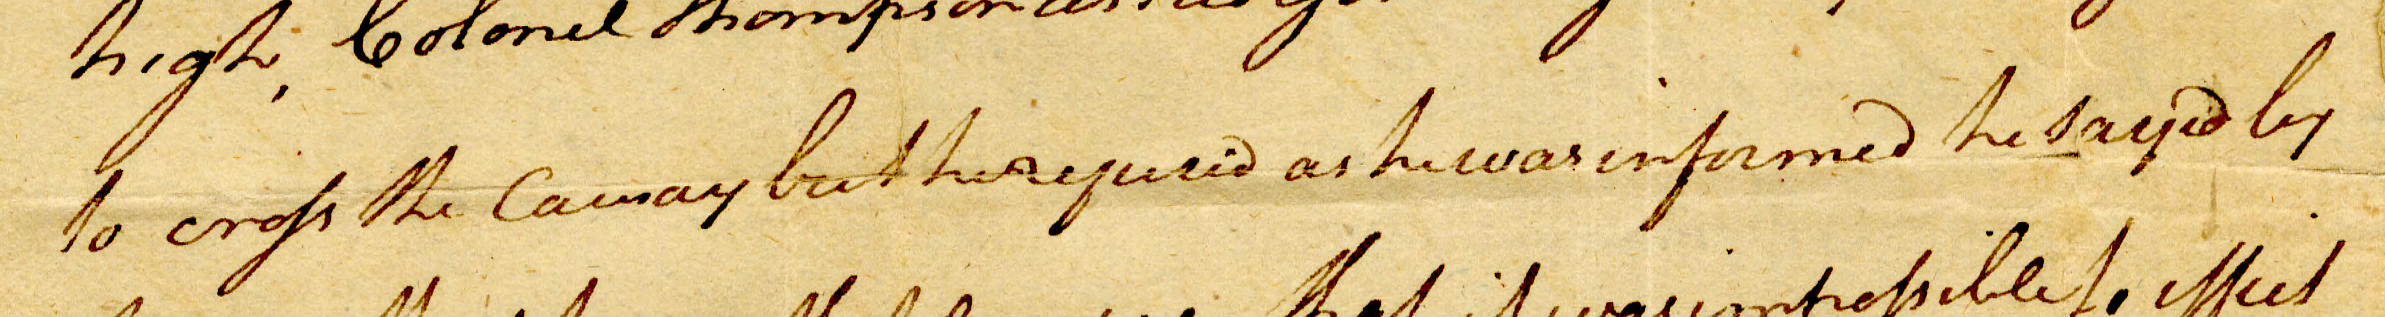to cross the Causay but he refused as he was informed he sayed by
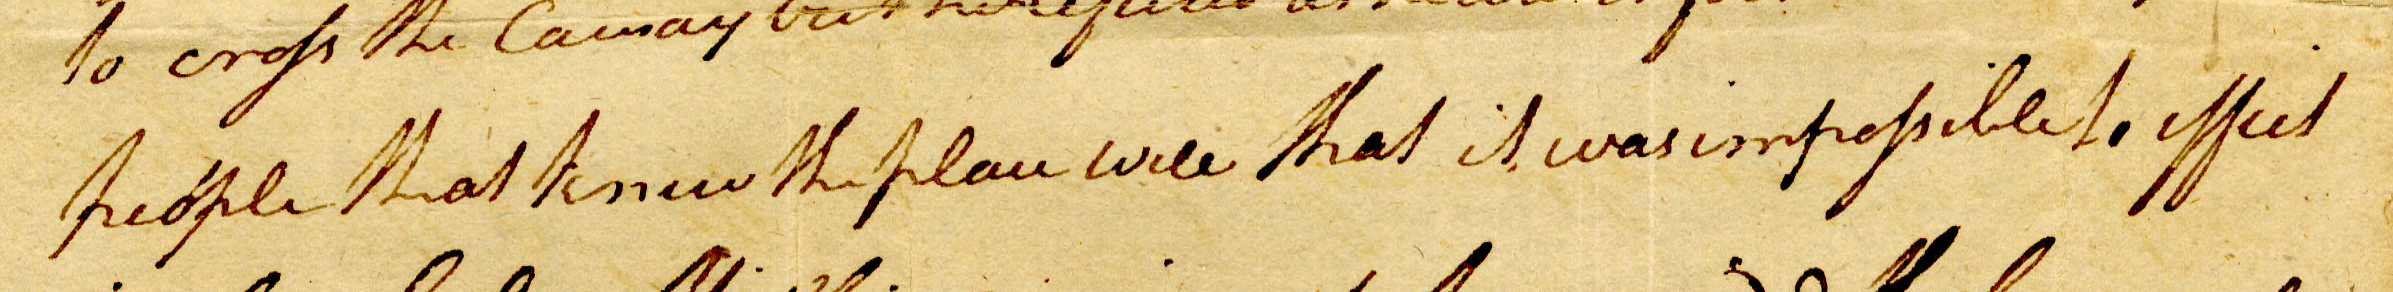people that knew the place well was that it was impossible to effect
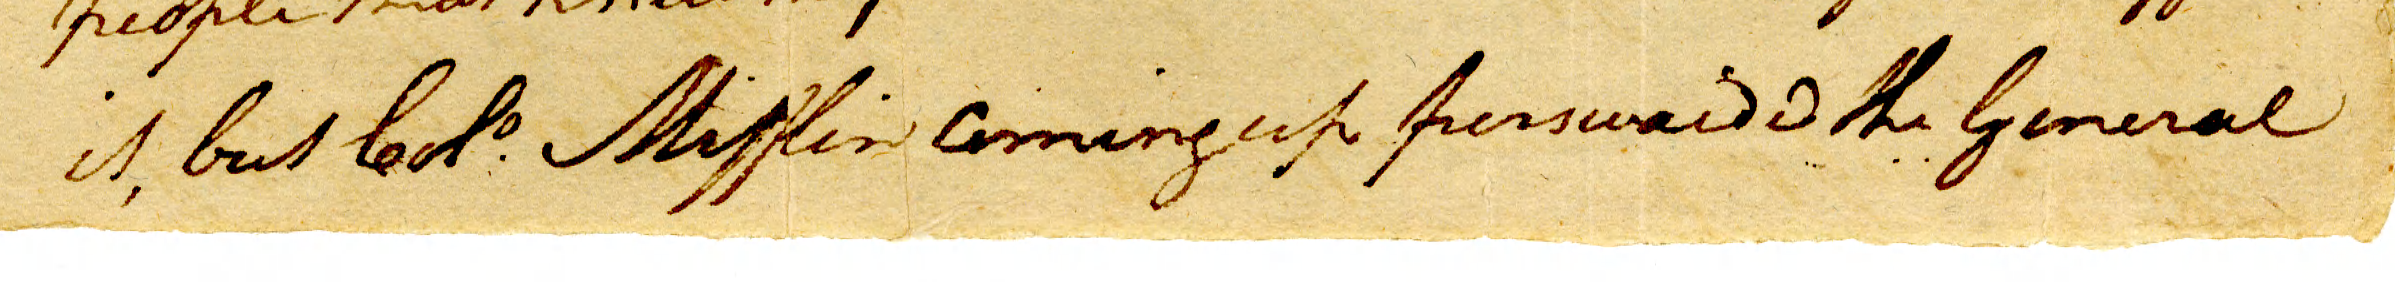it, but Col^o. Mifflin coming up perswaided the General
